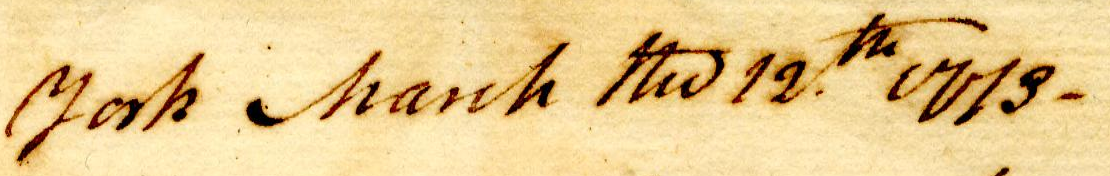York March the 12^th 1773
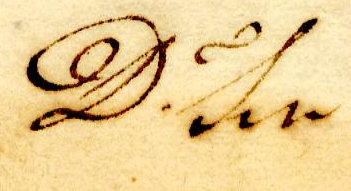D^r Sir
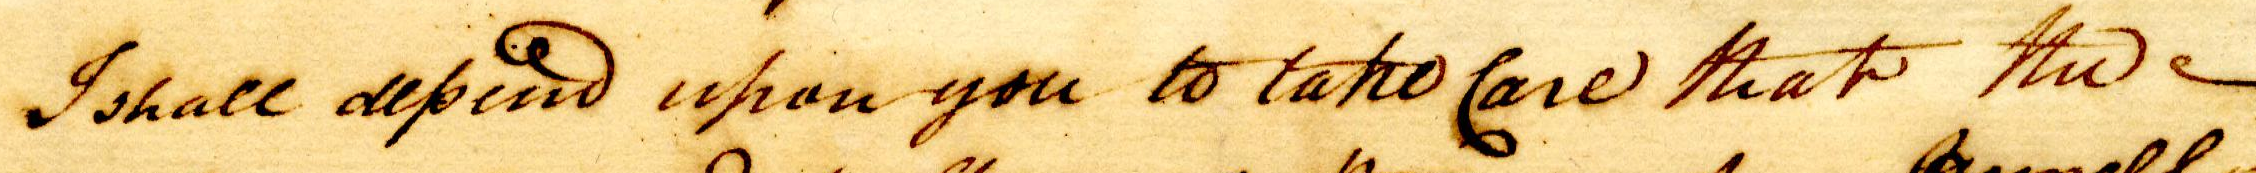I shall depend upon you to take Care that the
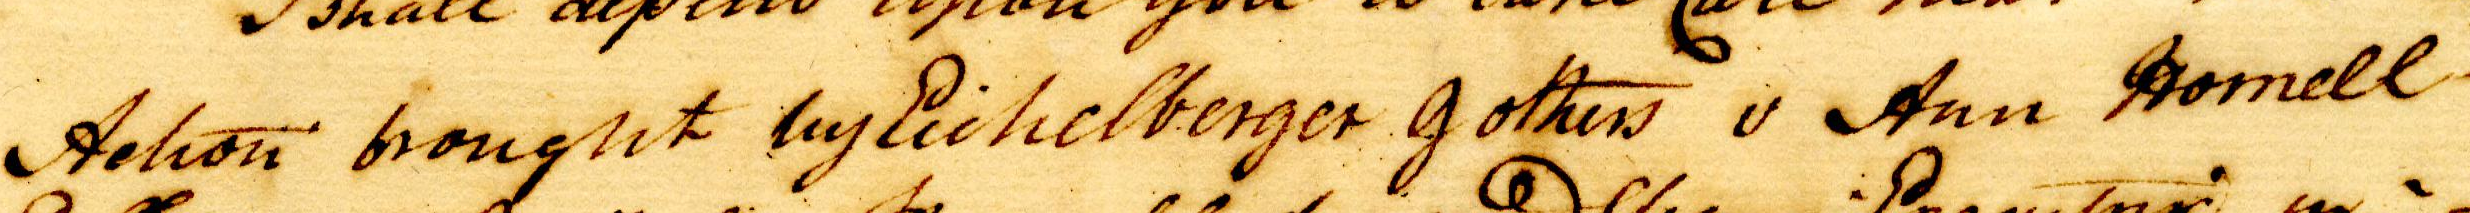Action brought by Eichelberger & others is Ann Homell
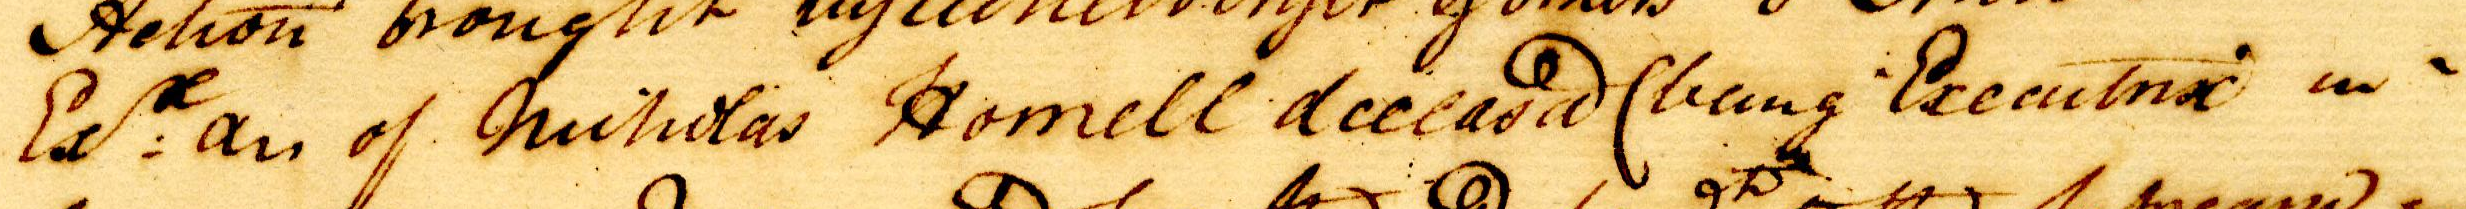Ex^ an of Nicholas Homell deceased (being Executned in
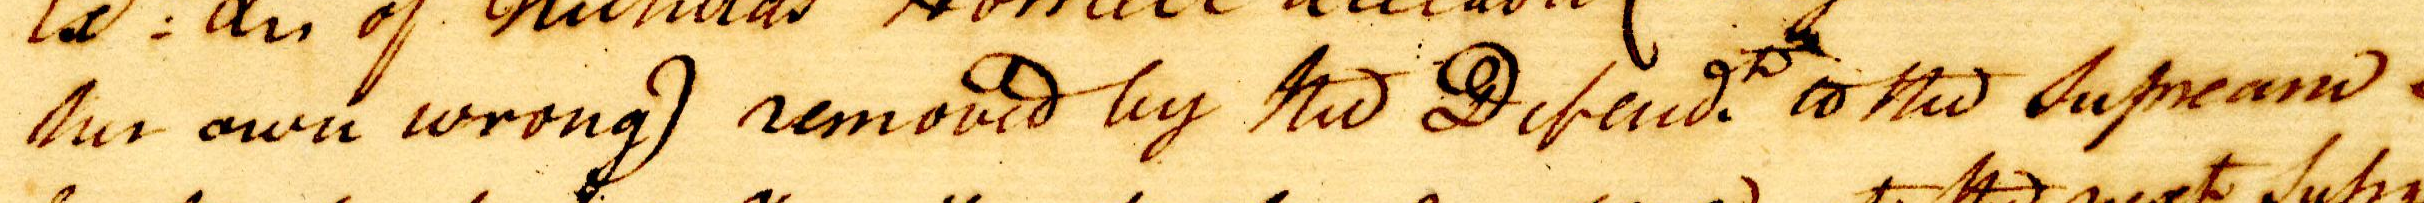her own wrong) removed by the Defend^t to the Supream
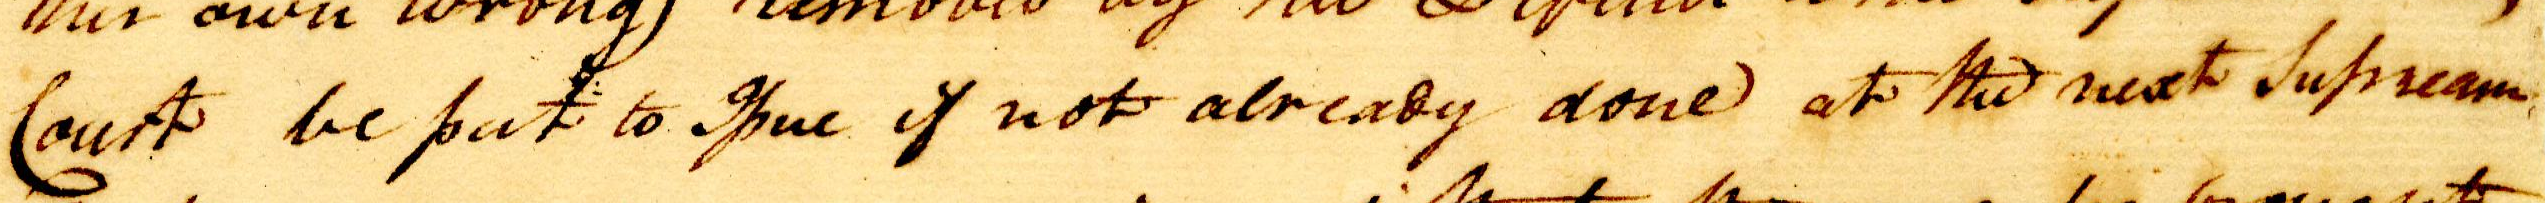Court be put to Issue if not already done at the next Supream
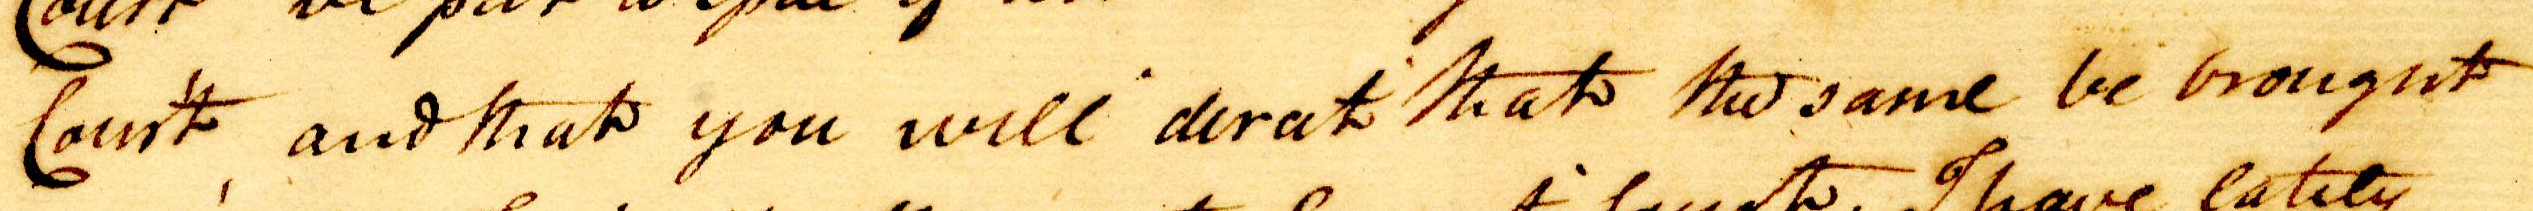Court and that you will direct that the same be brought
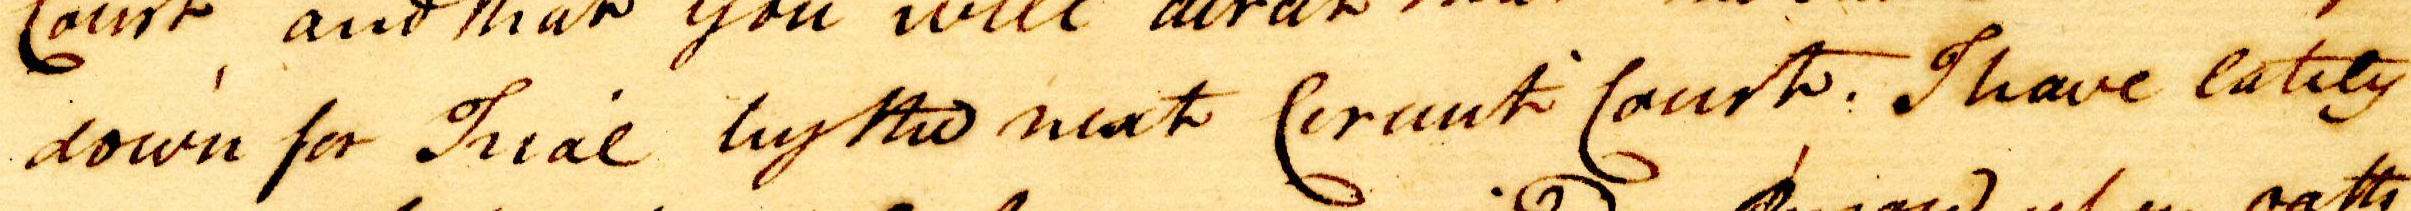down for Trial by the next Circuit Court. I have lately
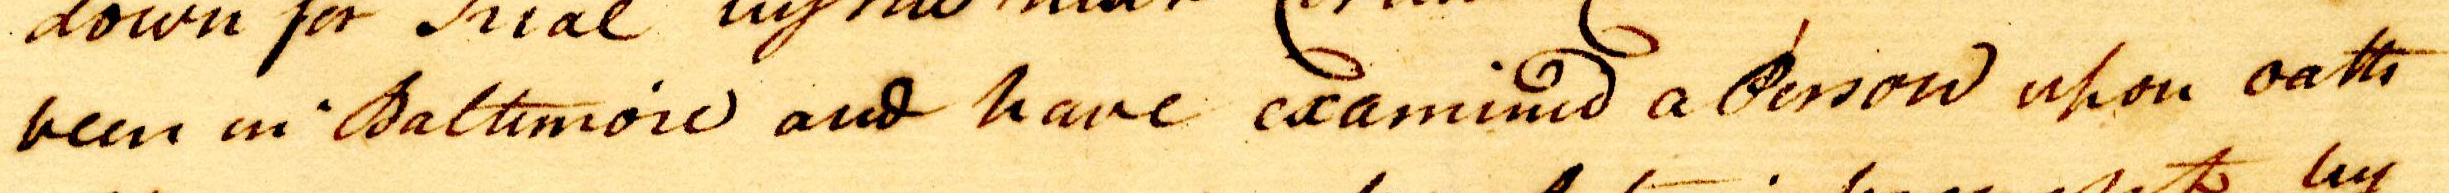been in Baltimore and hare examined a Person upon oath
